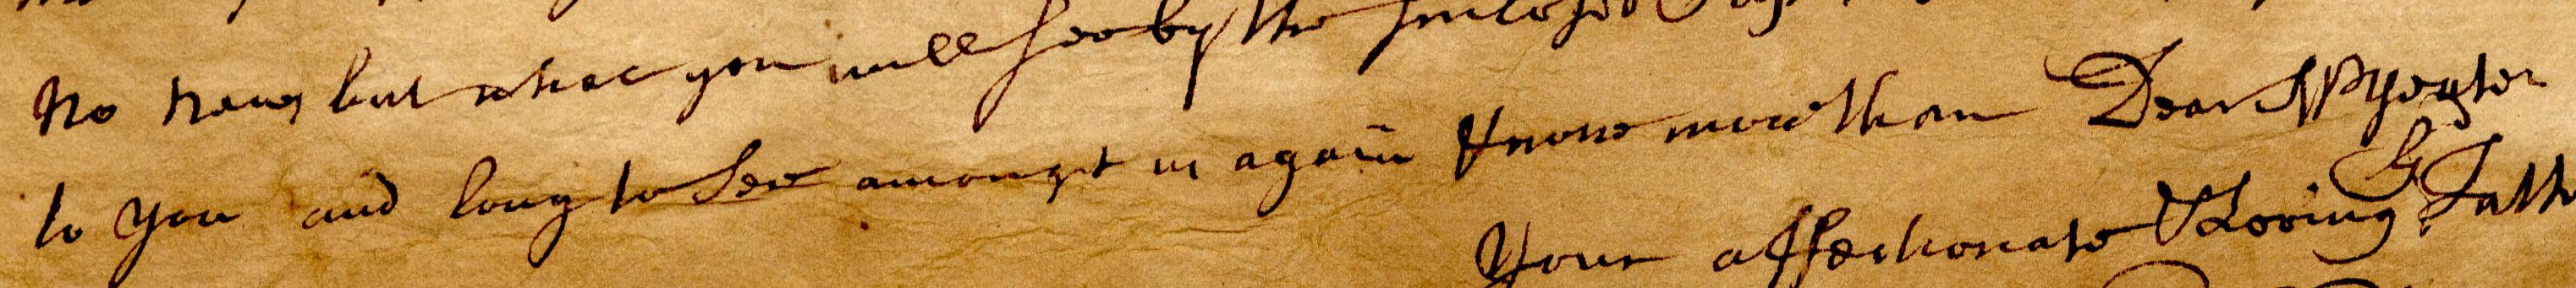to you and long to have amongst us again your more than Dear JP Yeates
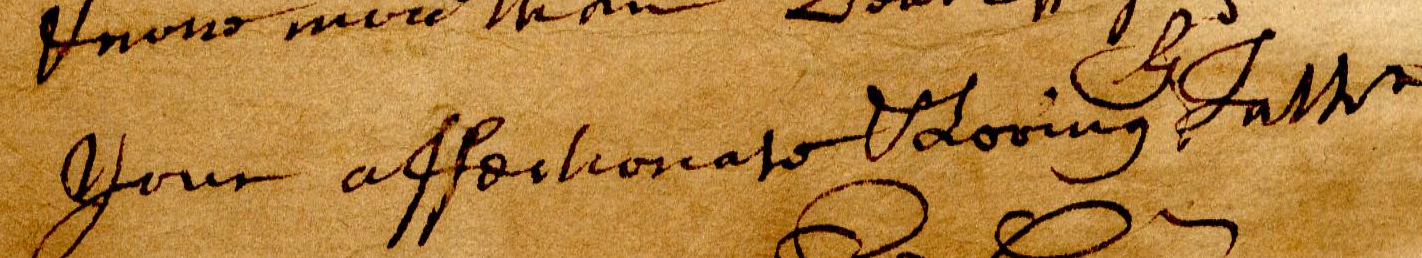Your affectionate & Loving Fath^r
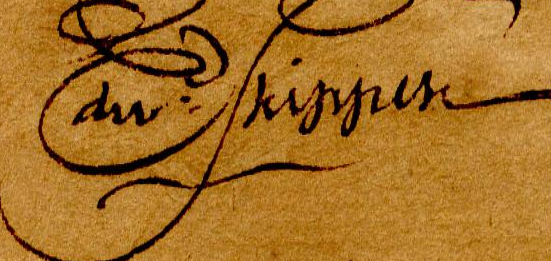Edw. Shippen
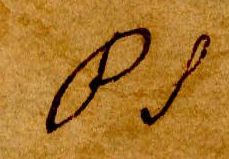PS
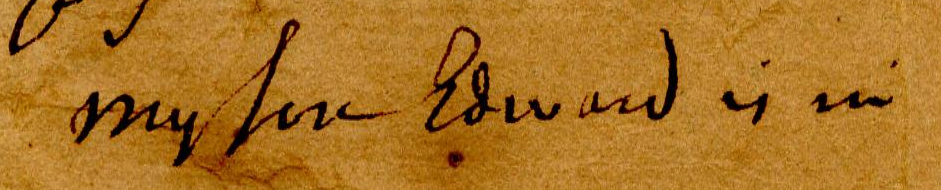My son Edward is in
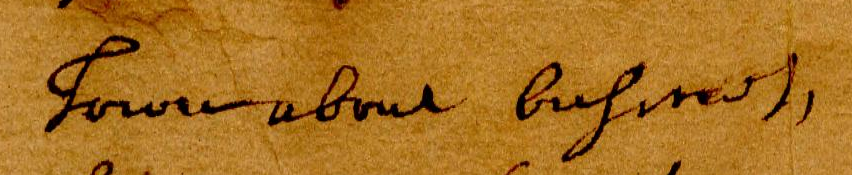town about business,
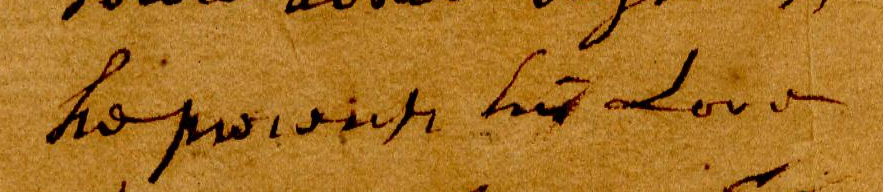he presents his Love
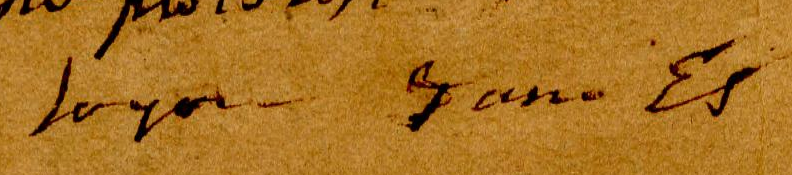to you- I am ES
